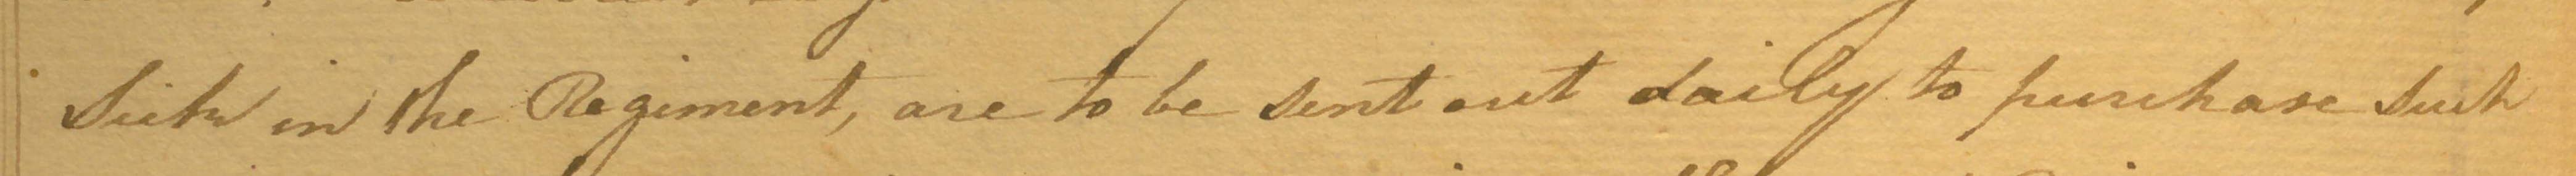Sick in the Regiment, are to be sent out daily to purchase such
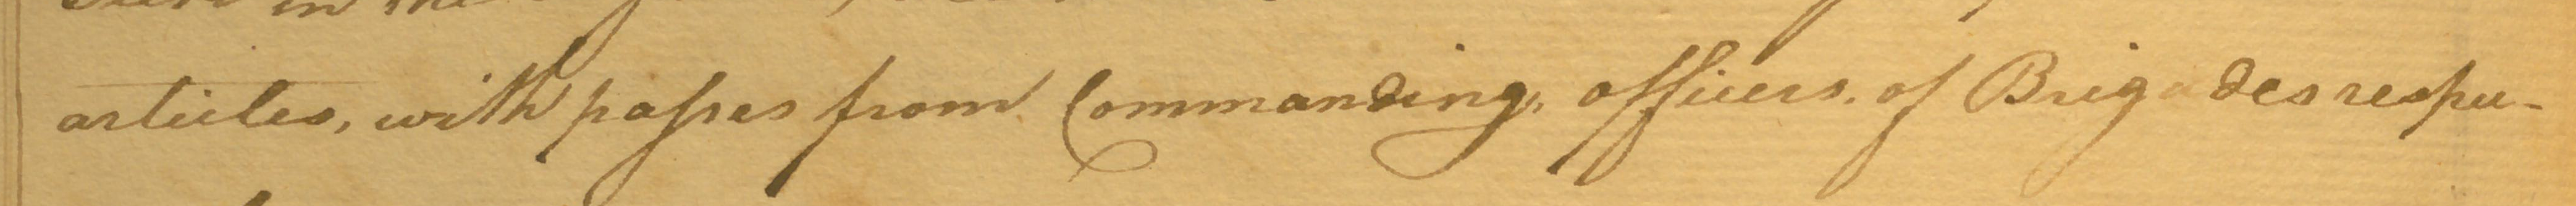articles, with passes from Commanding officers of Brigades respec-
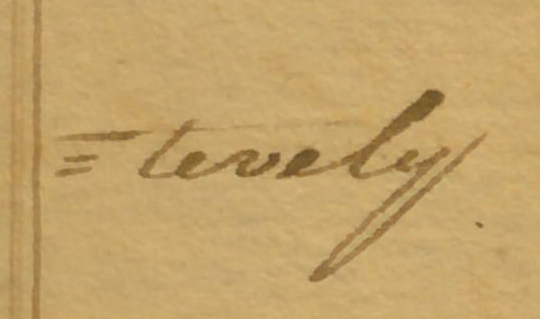-tively.
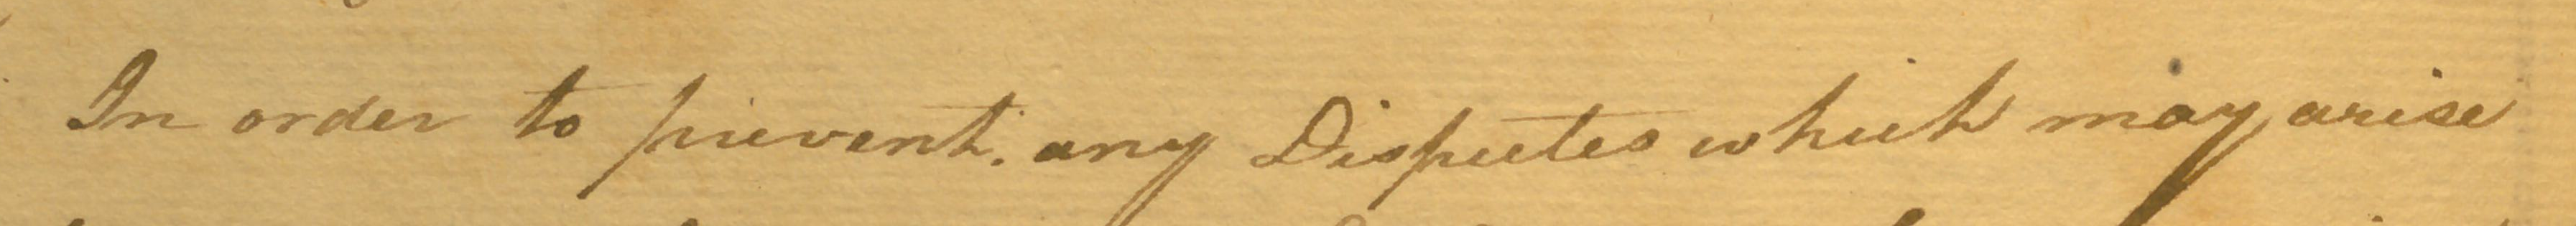In order to prevent any Disputes which may arise
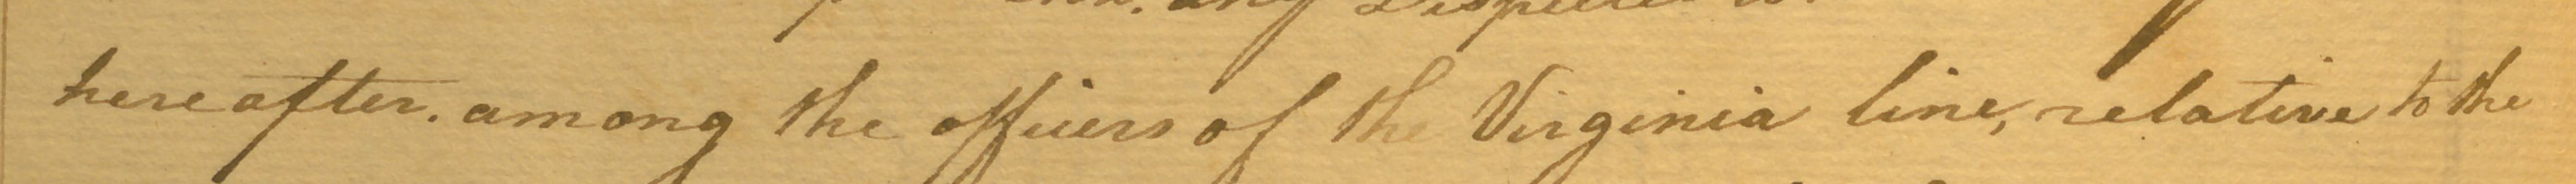hereafter among the officers of the Virginia line, relative to the
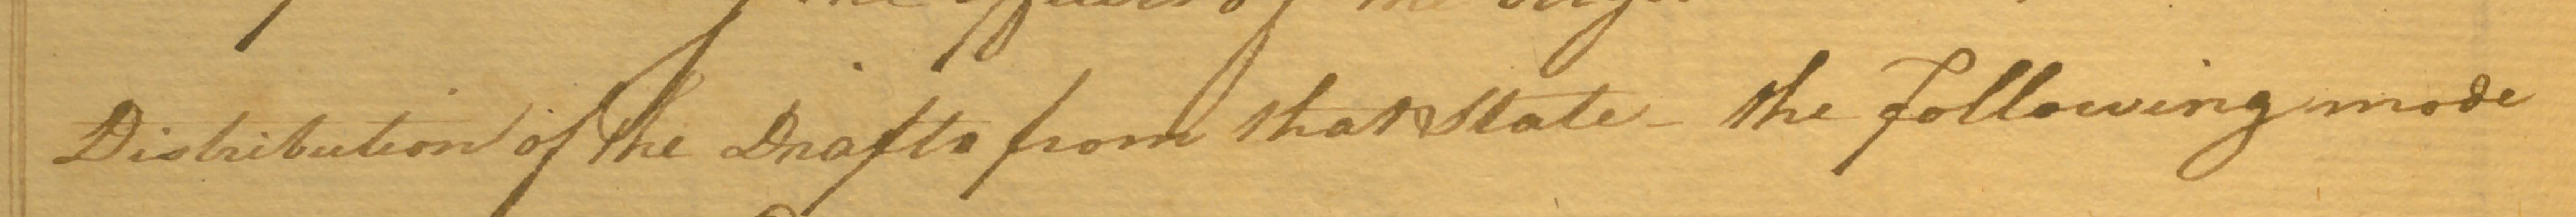Distribution of the Drafts from that State- the following mode
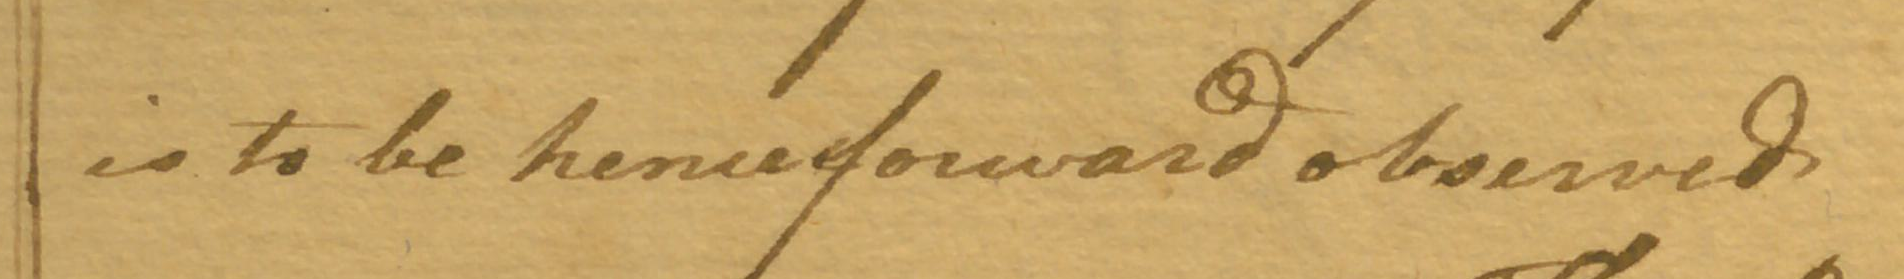is to be henceforward observed
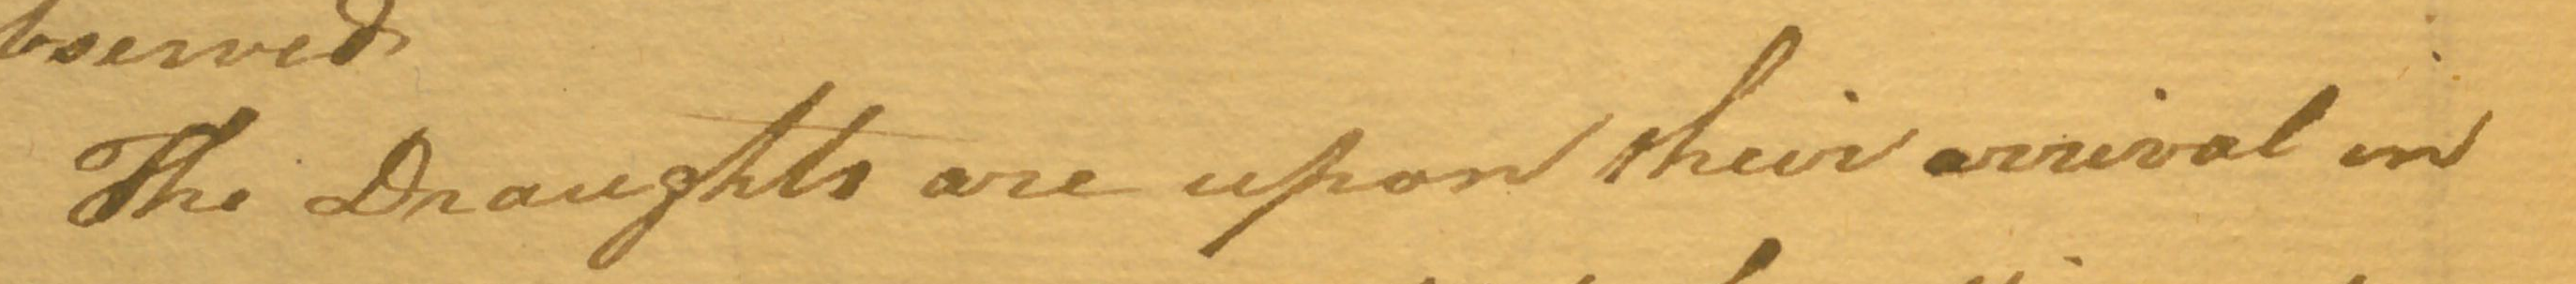The Draughts are upon their arrival in
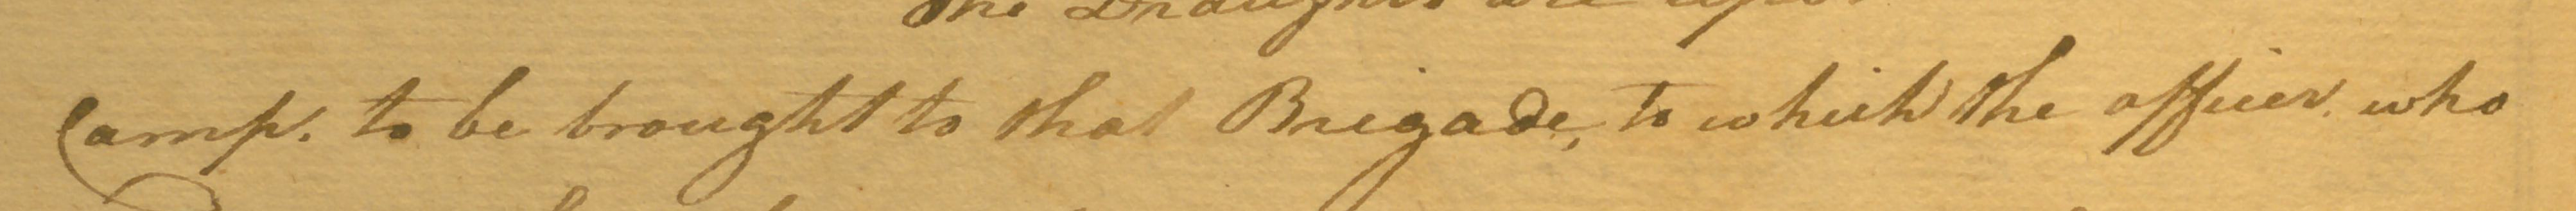Camp to be brought to that Brigade, to which the officer who
